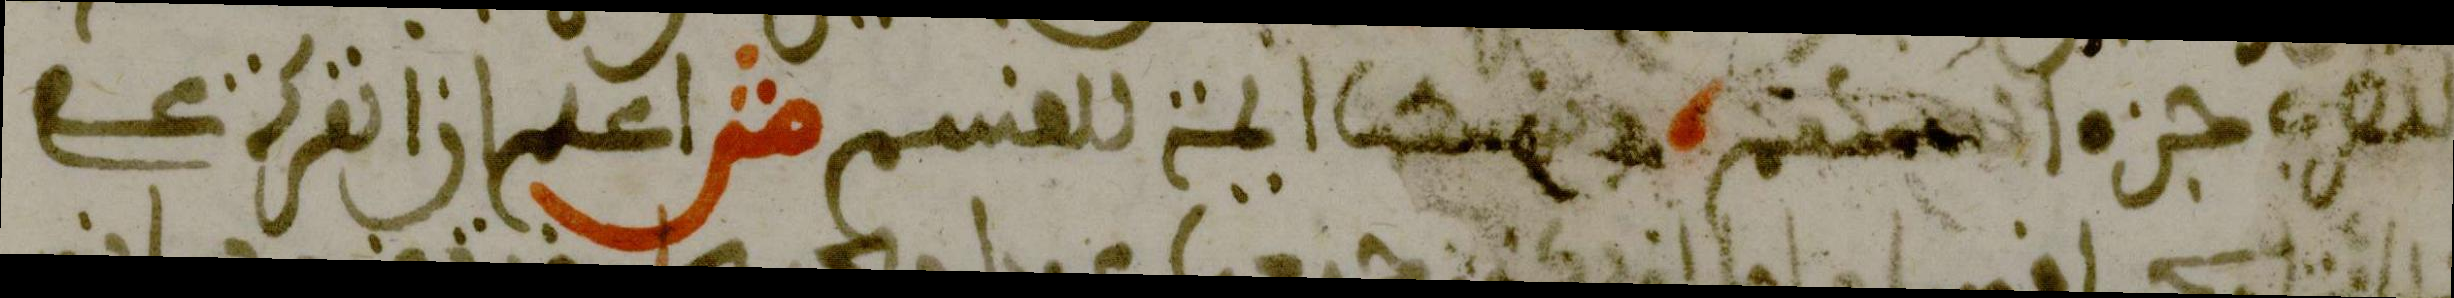للضرب جزء السهم وبسطها ايمة القسم ش اعلم ان التركة على
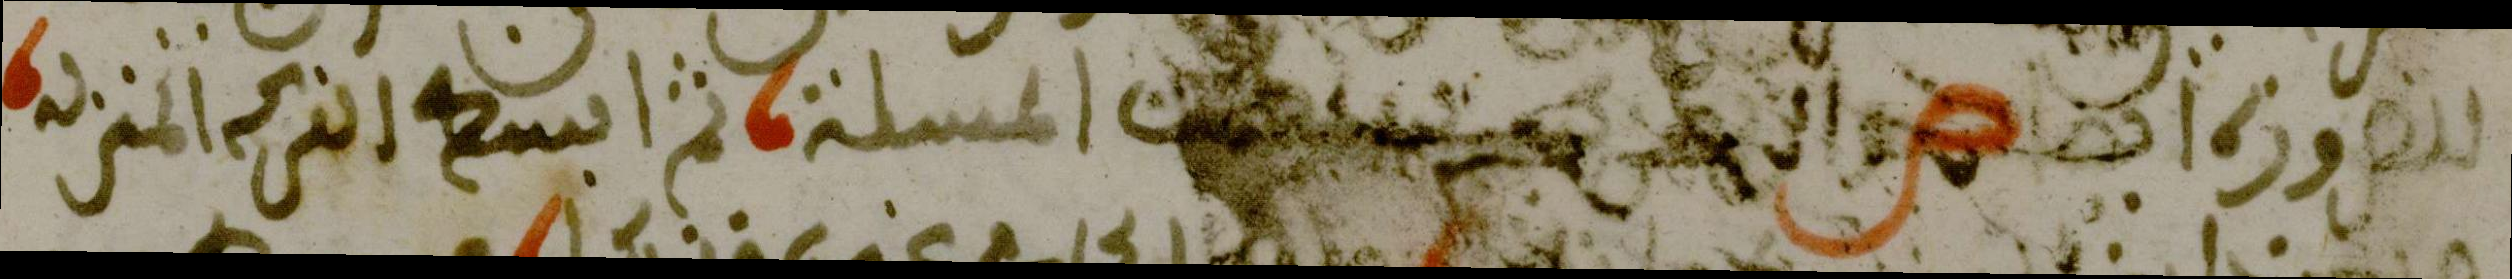للضرورة ايضا ص وان يكن كسر بسطت المسلة ثم ابسط التركة المنزلة
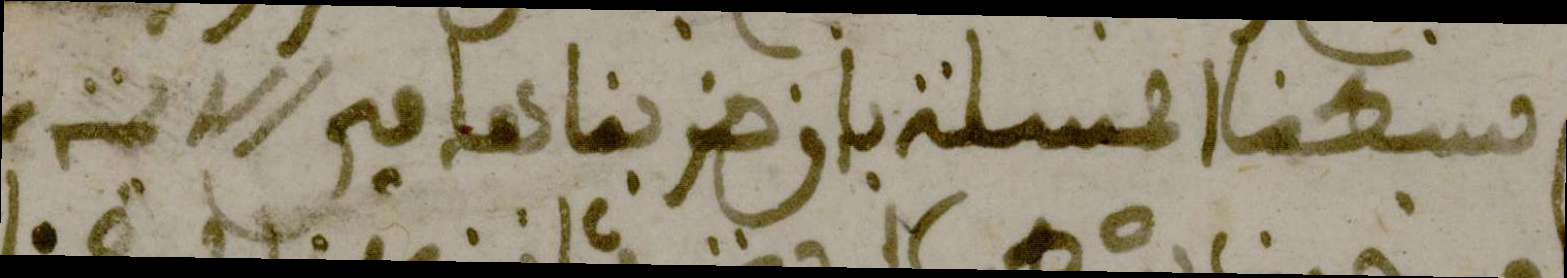بسطنا المسلة بان ضربناها في الايمة
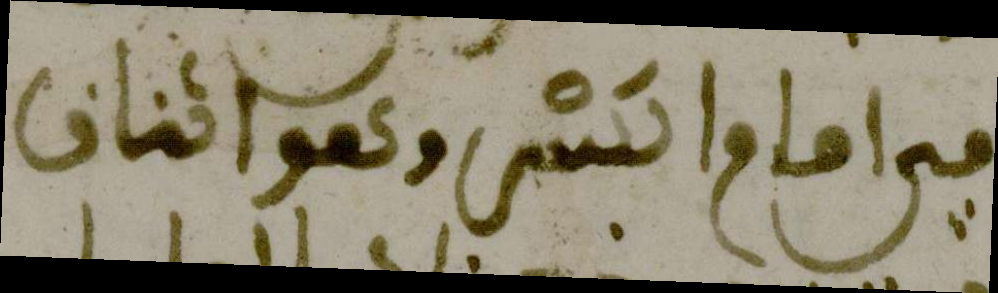في امام الكسْر وهو اثنان
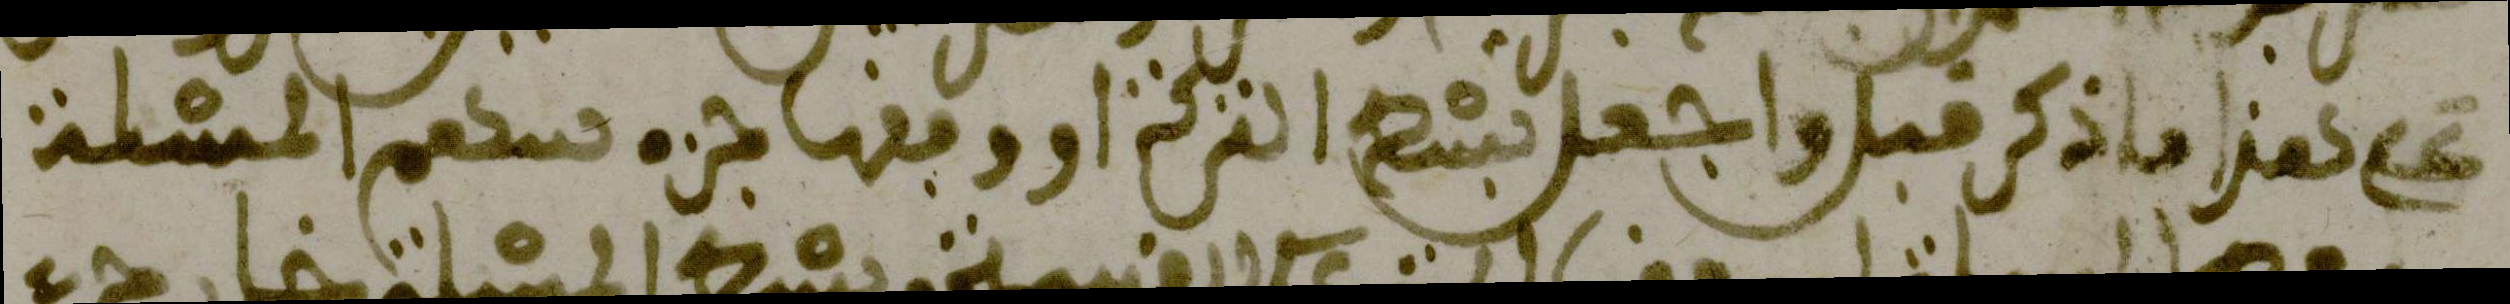عَلى هذا ما ذكر قبل واجعل بسْط التركة او وفقها جزء سهم المسْلة
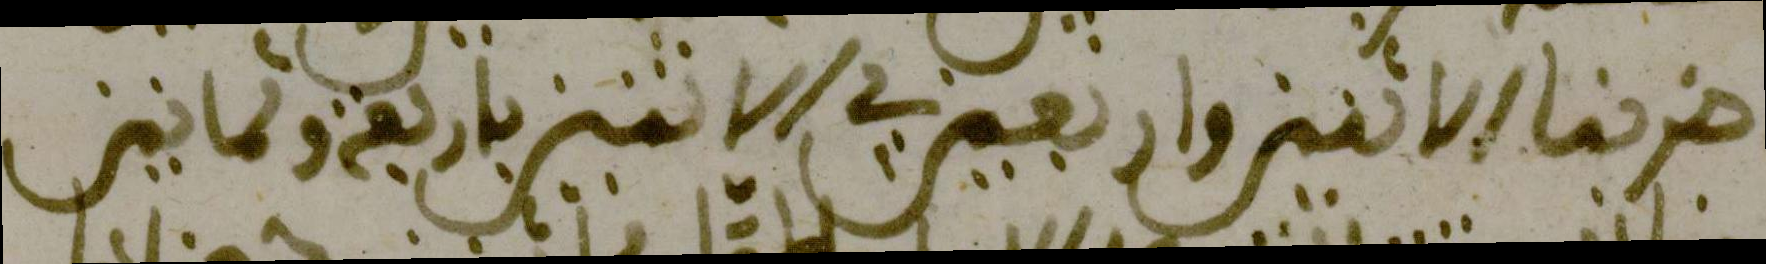ضربنا الاثنين واربعين في الاثنين باربعة وثمانين
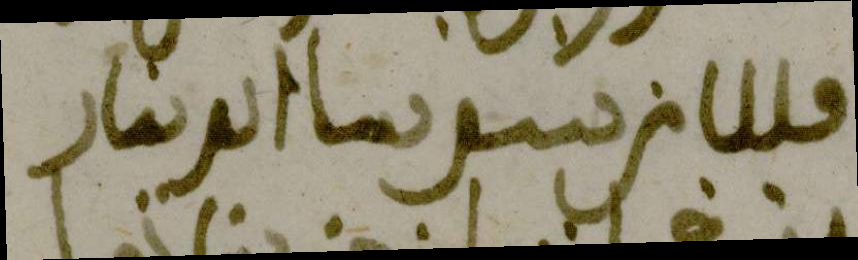فللابن سدسا الدينار
